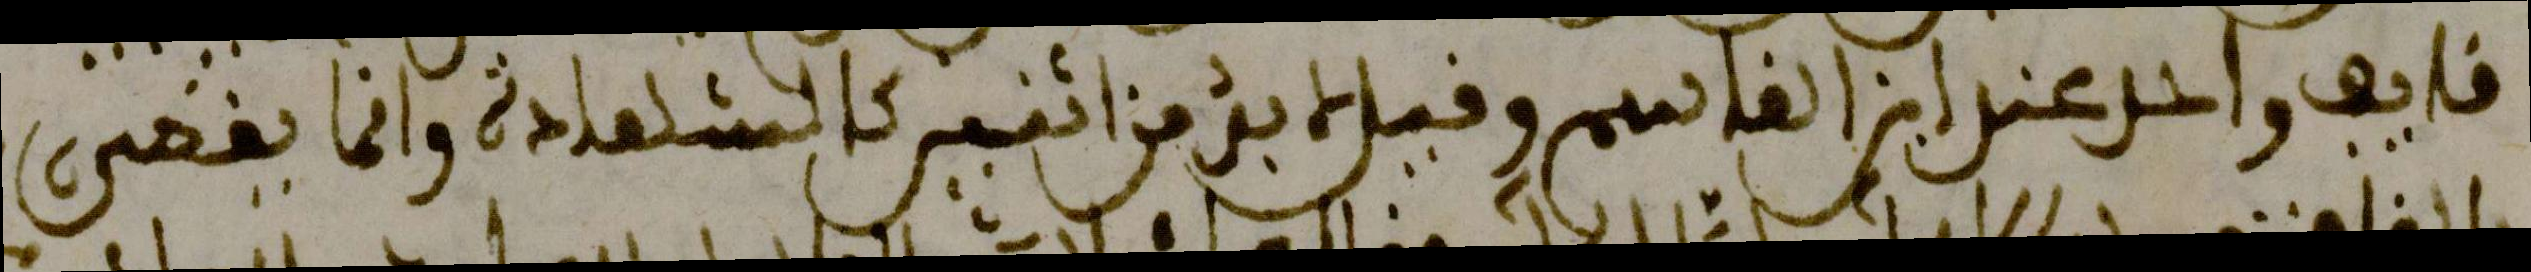قايف واحد عند ابن القاسم وقيل لا بد من اثنين كالشهادة وانما يقضى
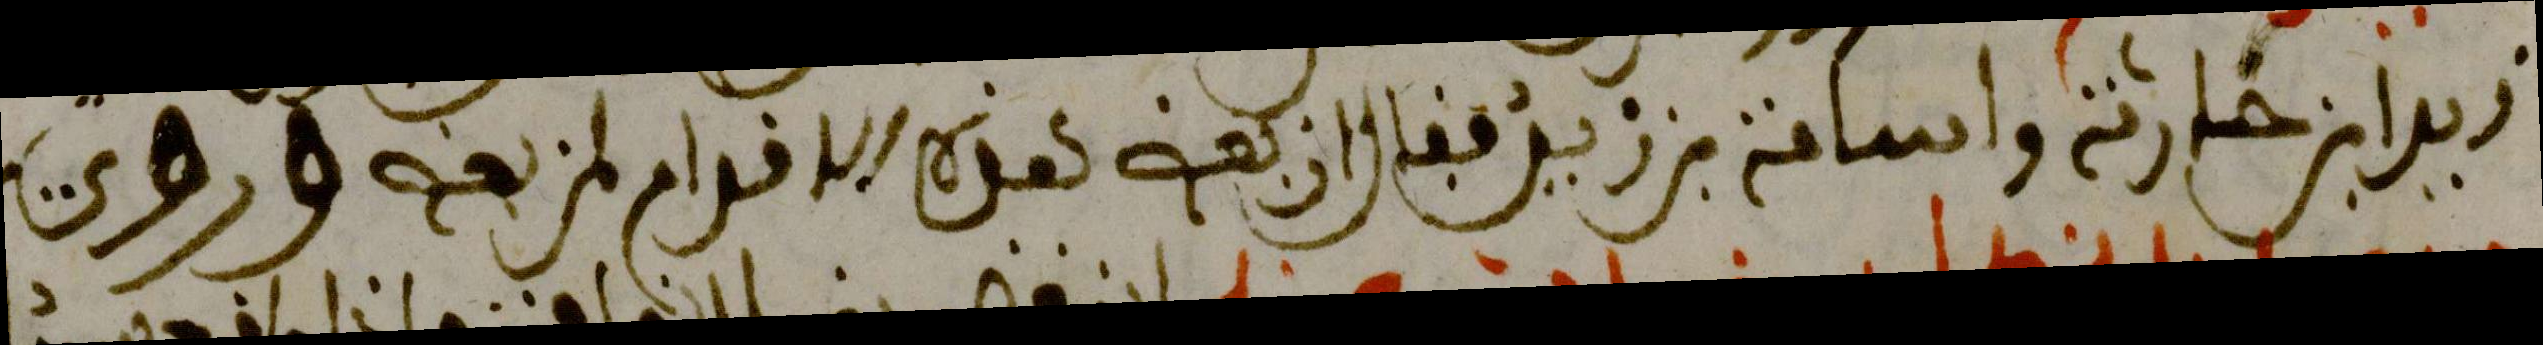زيد ابن حارثة واسمة بن زيد فقال ان بعض هذه الاقدام لمن بعض وروي
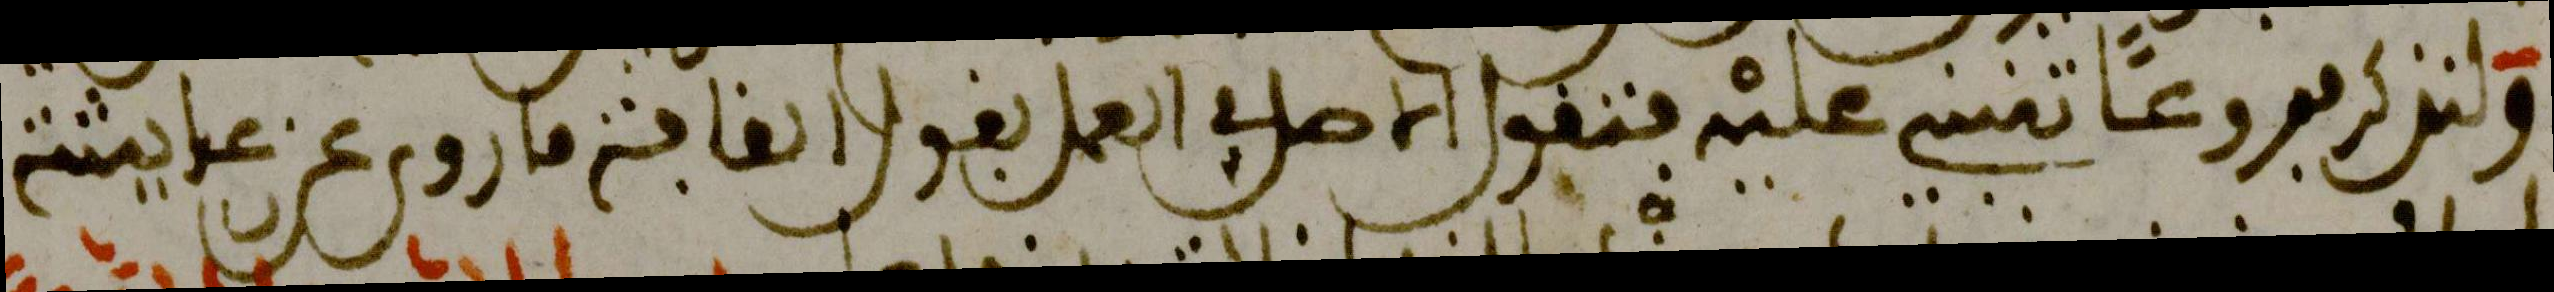ولنذكر فروعًا تنبني عليْه فتقول الاصل في العمل بقول القافة ما روى عن عايشة
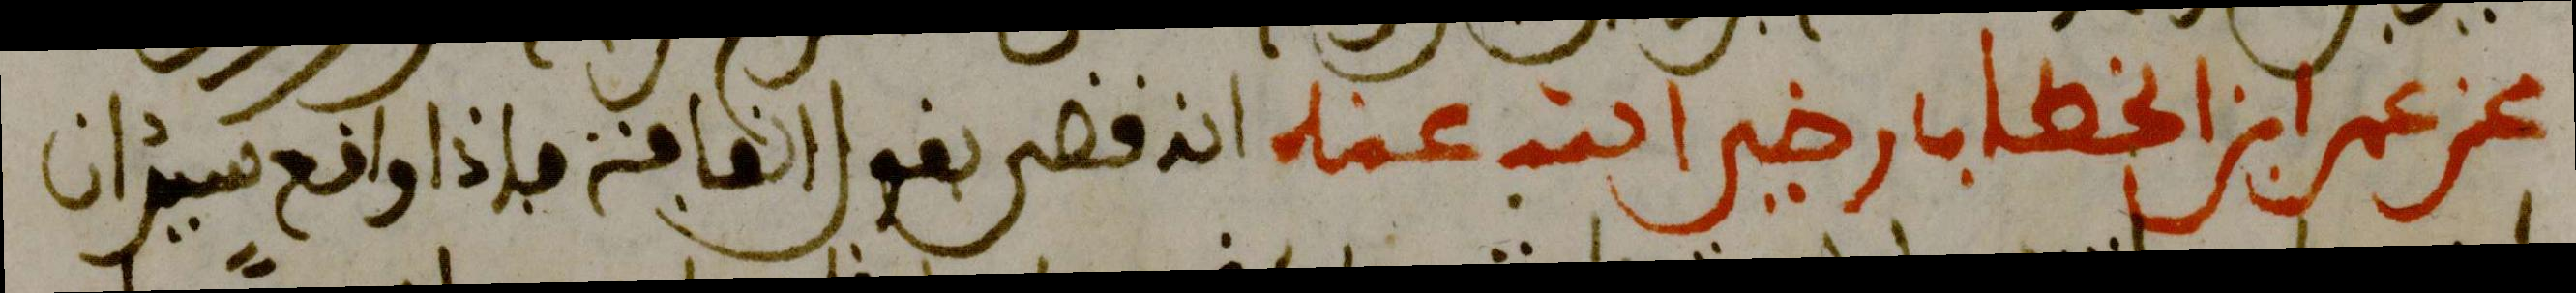عن عمر ابن الخطاب رضي الله عنه انه قضى بقول القافة فاذا واقع سيدان
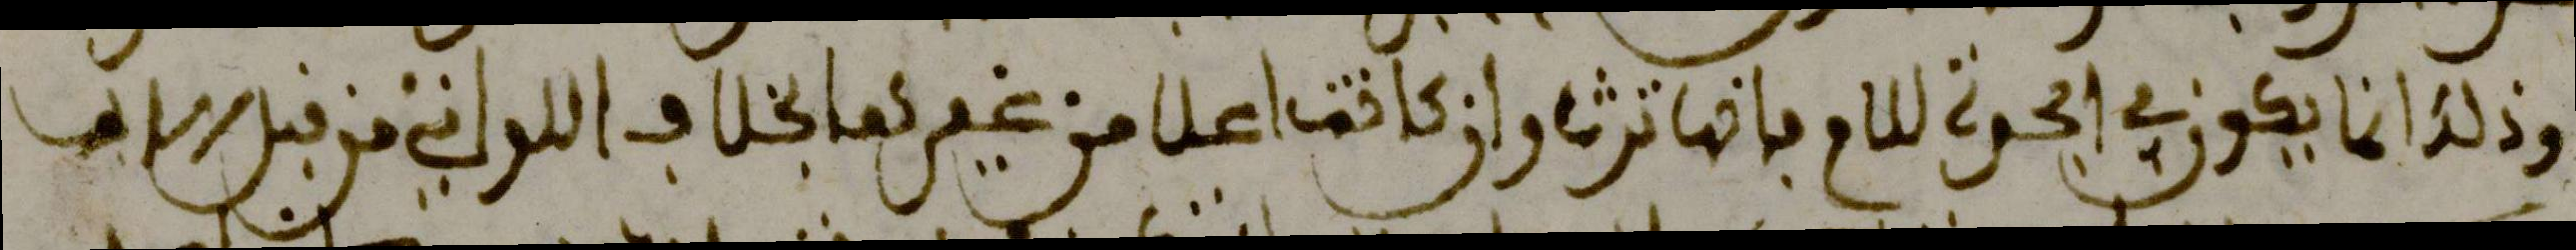وذلك انما يكون في الجدة الام فانها ترث وان كانت اعلا من غير ها بخلاف اللواتي من قبل الاب
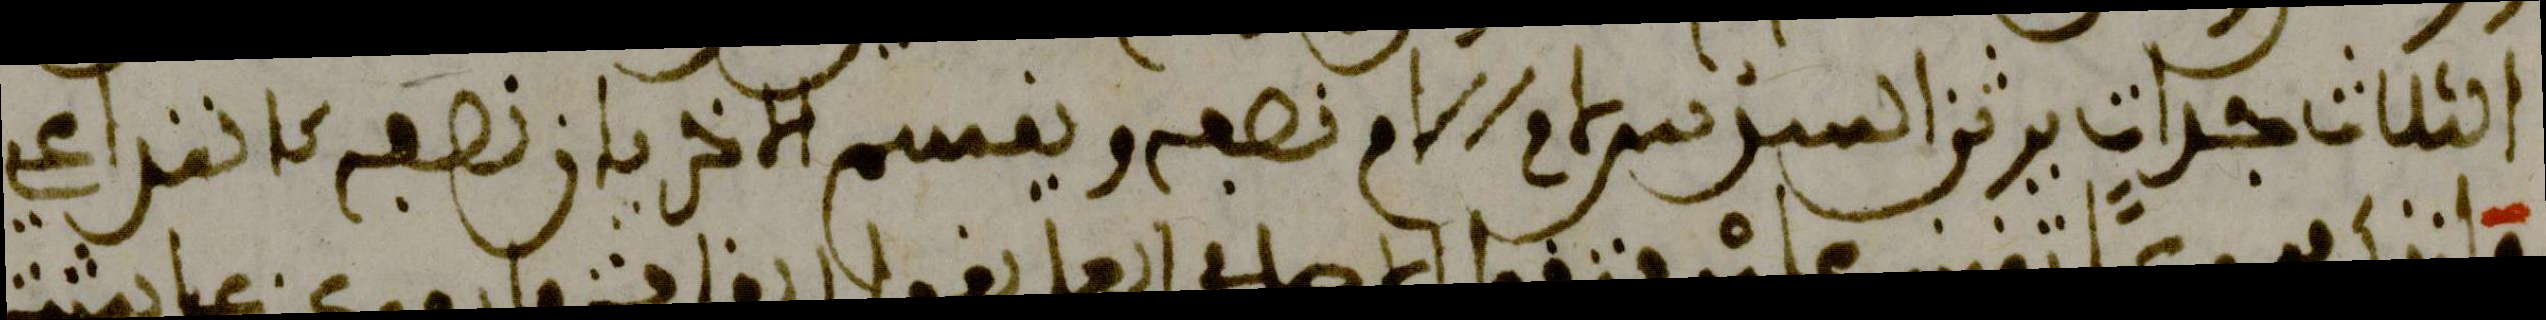الثلاث جدات يرثن السدس لام الام نصفه ويقسم الاخريان نصفه كالتداعي
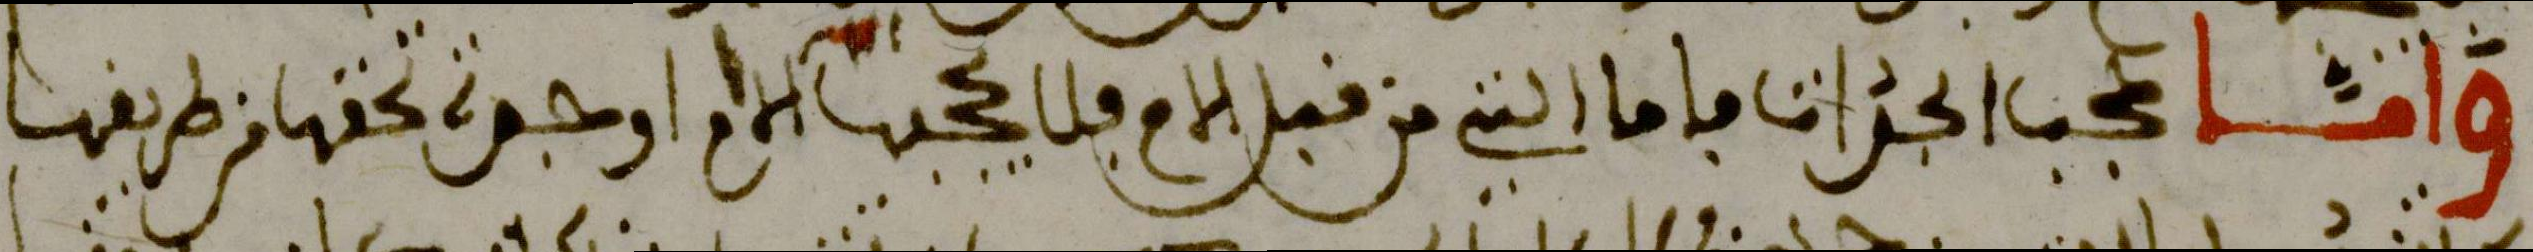واما حجب الجدات فاما التي من قبل الام فلا يحجبها الام او جدة تحتها من طريقها
